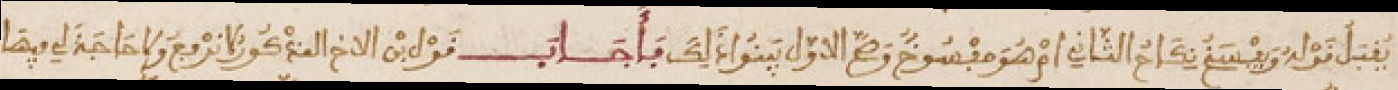يقبل قوله ويفسخ نكاح الثاني ام هو مفسوخ وصح الأول بينوا ذلك فاجاب قول ابن الاخ المذكور لا نرفع ولا حاجة لي فيها
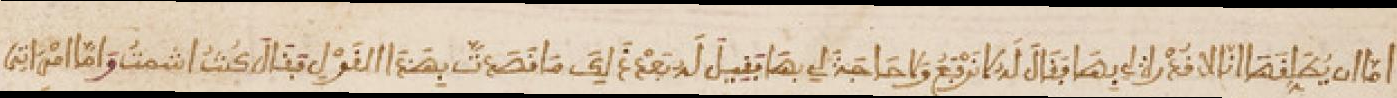اما ان يطلقها انا لا قدرة لي بها فقال له لا نرفع ولا حاجة لي بها فقيل له بعد ذلك ما قصدت بهذا القول فقال كنت اشمت واما امراتي
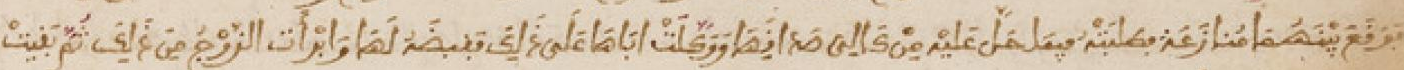فوقع بينهما منازعة فطلبته فيما حل عليه من كالى صداقها ووكلت اباها على ذلك فقبضه لها وابرأت الزوج من ذلك ثم بقيت
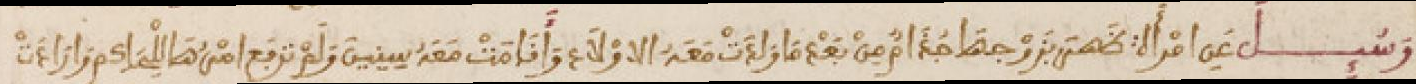وسئل عن امرأة ظهر بزوجها جذام من بعد ما ولدت معه الاولاد واقامت معه سنين ولم ترفع امرها الى الحاكم وارادت
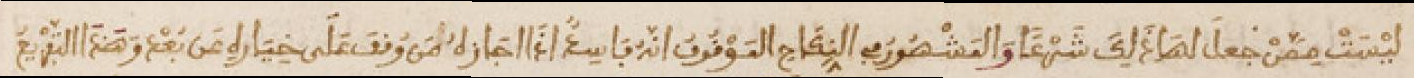ليست ممن جعل لها ذلك شرعا والمشهور في النكاح الموقوف انه فاسد اذا اجازه من وقف على خياره عن بعد وهذا التفريع
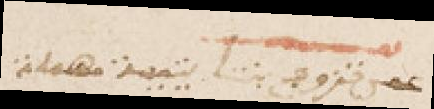عمن تزوج بنتا يتيمة مهملة
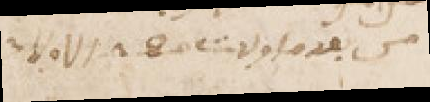من بعدما ولدت معه اولاد
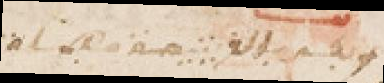عن بكر بالغ يتيمة مهملة
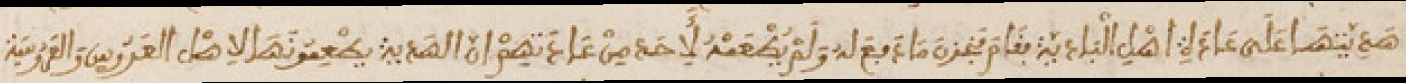هديتها على عادة اهل البادية فقام فخزن ما دفع له ولم يطعمه لاحد من عادتهم ان الهدية يطعمونها لاهل العروس والعروسة
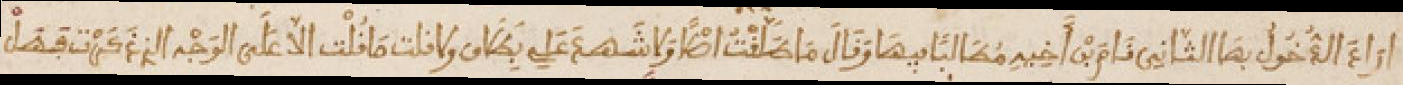اراد الدخول بها الثاني قام بن أخيه مطالبا فيها وقال ما طلقت اصلا ولا شهد علي بطلاق ولا قلت ما قلت إلا على الوجه الذي ذكرت فهل
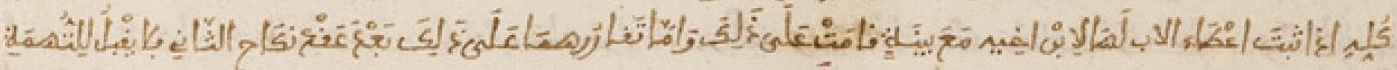كله اذا ثبت اعطاء الاب لها لابن اخيه مع ببينة قامت على ذلك واما تقاررهما على ذلك بعد عقد نكاح الثاني فلا يقبل للتهمة
